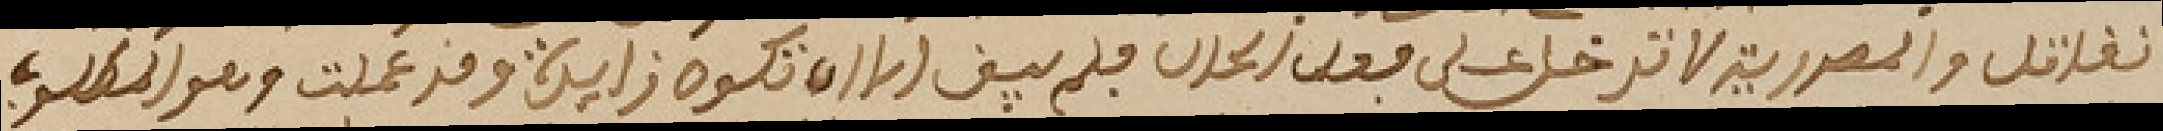نقاتل والمصدرية لا تدخل على فعل الحال فلم يبق الا ان تكون زائدة وقد عملت وهو المطلوب
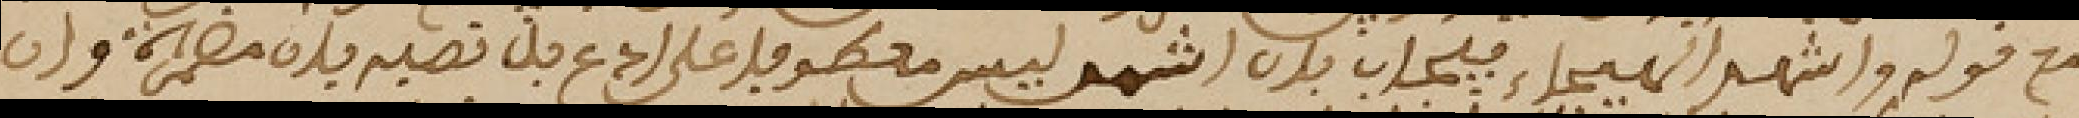مع قوله واشهد الهيجاء فيجاب بان اشهد ليس معطوفا على ادع بل نصبه بان مضمرة وان
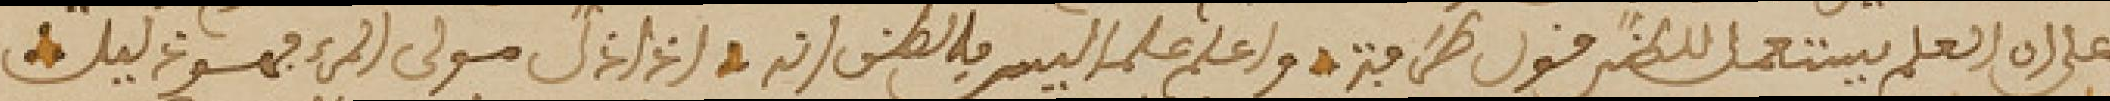على ان العلم يستعمل للظن قول طرفة واعلم علما ليس بالظن انه اذا ذل مولى المرء فهو ذليل
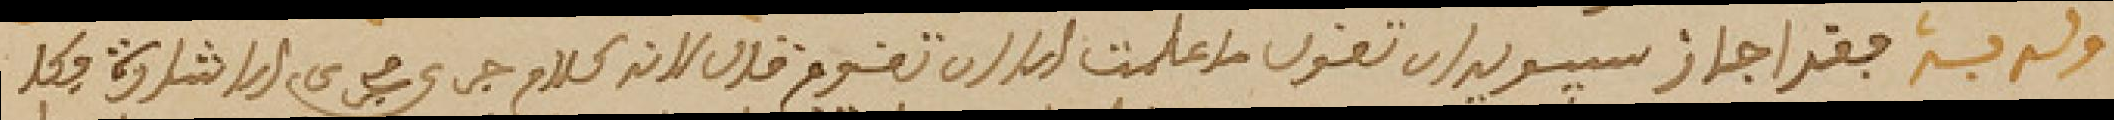وله به فقد أجاز سيبويه ان تقول علمت الا ان تقوم قال لانه كلام جرى مجرى الإشارة فكا
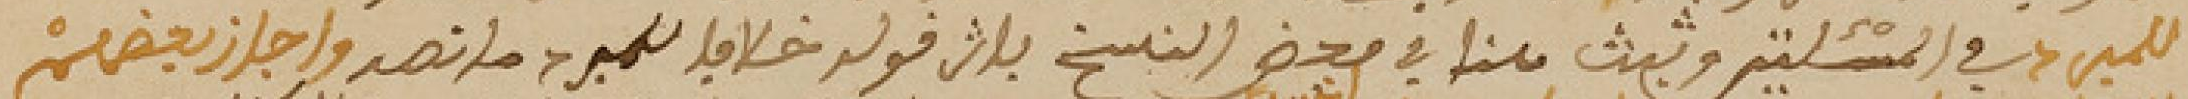للمبرد في المسئلتين وثبت منا بعض النسخ باثر قوله خلافا للمبرد مانصه واجاز بعضهم
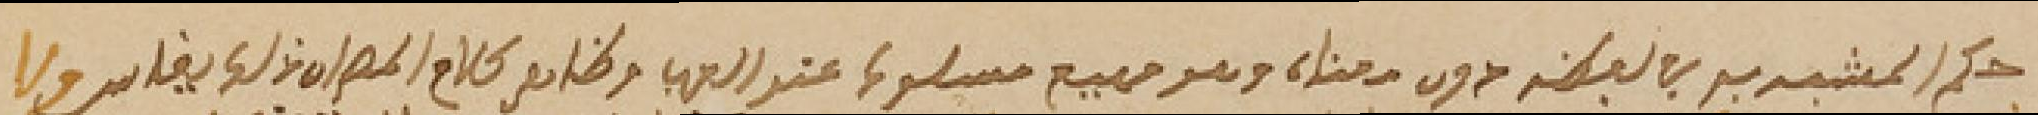حكم المشبه به في لفظه دون معناه وهو مهيع مسلوك عند العرب وظاهر كلام المصر ان ذلك يقاس ولا
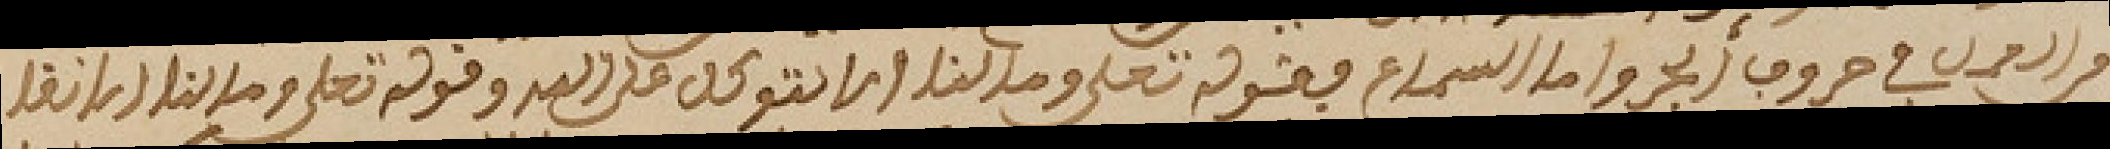من العمل في حروف الجر واما السماع فقوله تعالى ومالنا الا نتوكل على الله وقوله تعلى ومالنا ان لا نقا
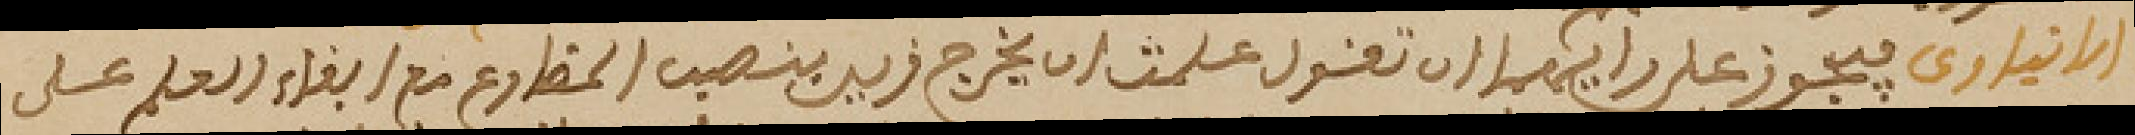الانباري فيجوز على رايهما ان تقول علمت ان يخرج زيد بنصب المضارع مع إبقاء العلم على
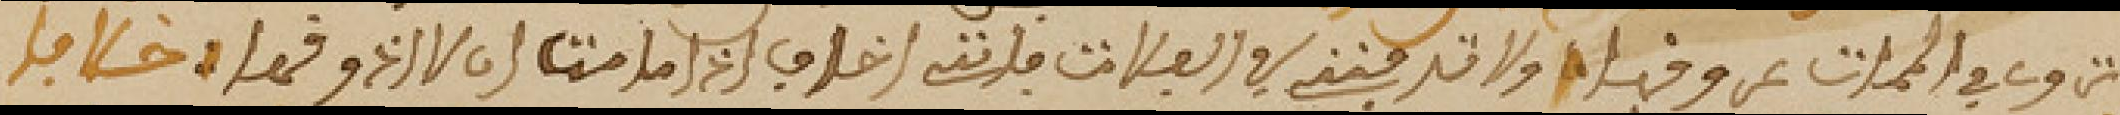ترود في الممات عروفها ولا تدفنني في الفلات فانني أخاف اذا مامت ان لا اذوقها خلافا
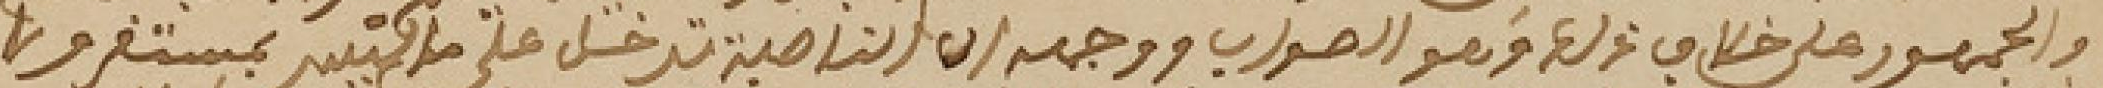والجمهور على خلاف ذلك وهو الصواب ووجهه ان الناصبة تدخل على ما ليس بمستقر ولا
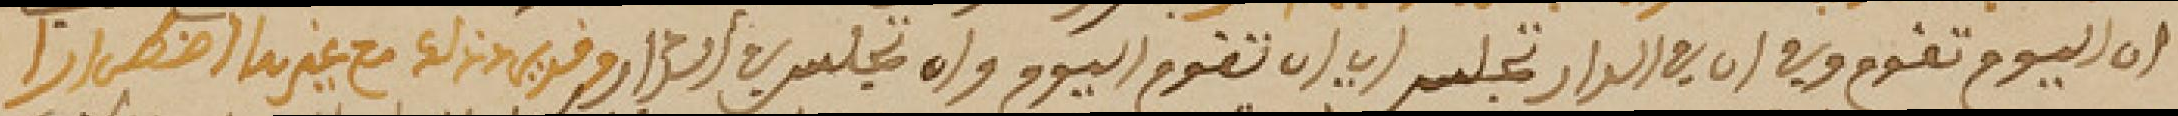ان اليوم تقوم وفي ان في الدار تجلس أي ان تقوم اليوم وان تجلس في الدار وقد يرد ذلك مع غيرها اضطرارا
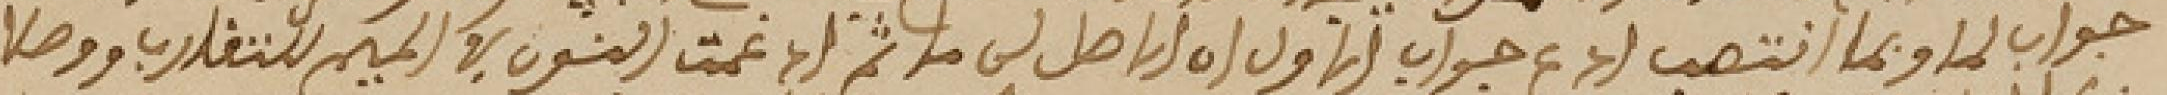جواب لما وبما انتصب ادع جواب الاول ان الاصل لي ما ثم ادغمت النون في الميم للتقارب ووصلا
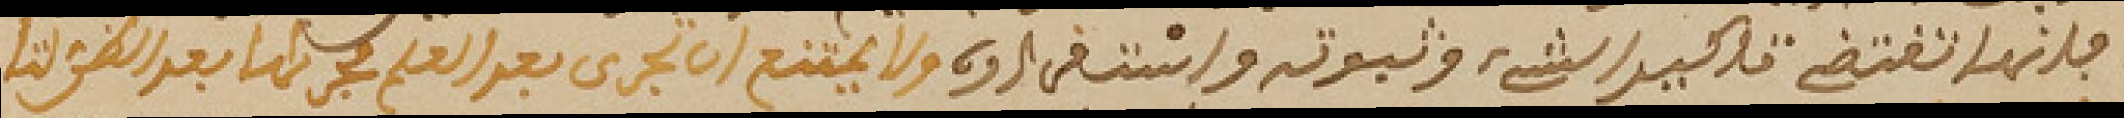فانها تقتضي تأكيد الشيء وثبوته واستقراره ولا يمتنع ان تجرى بعد العلم مجراها بعد الظن لتأ
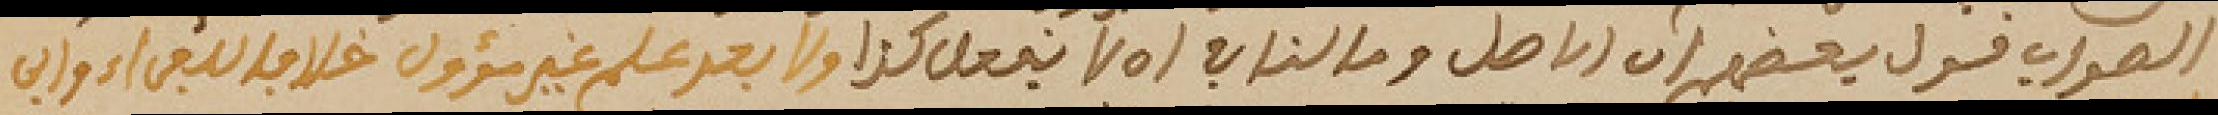الصواب قول بعضهم ان الأصل ومالنا في ان لا نفعل كذا ولا بعد علم غير مؤول خلافا للفراء وابن
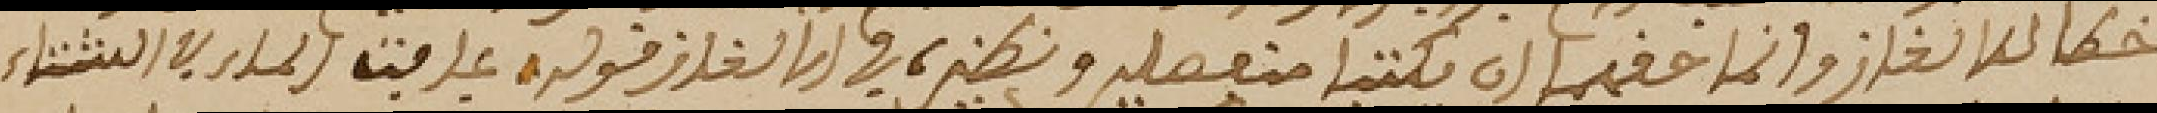خطا للالغاز وانما خفهما ان يكتبا منفصلين ونظيره في الالغاز قوله عافت الماء في الشتاء
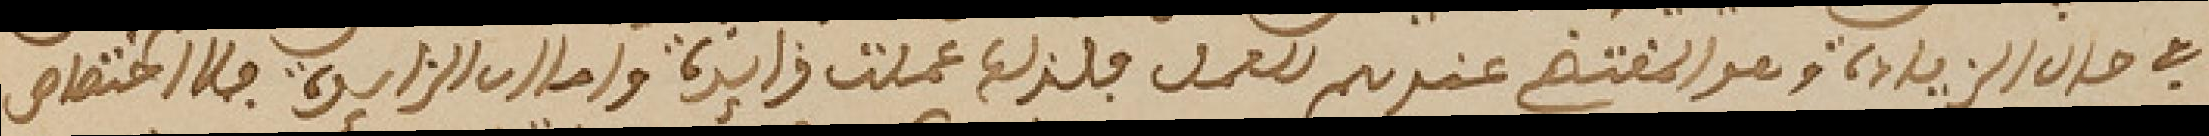في حال الزيادة وهوالمقتضى عندهم للعمل فلذلك عملت زائدة واما ان الزيادة فلا اختصاص
